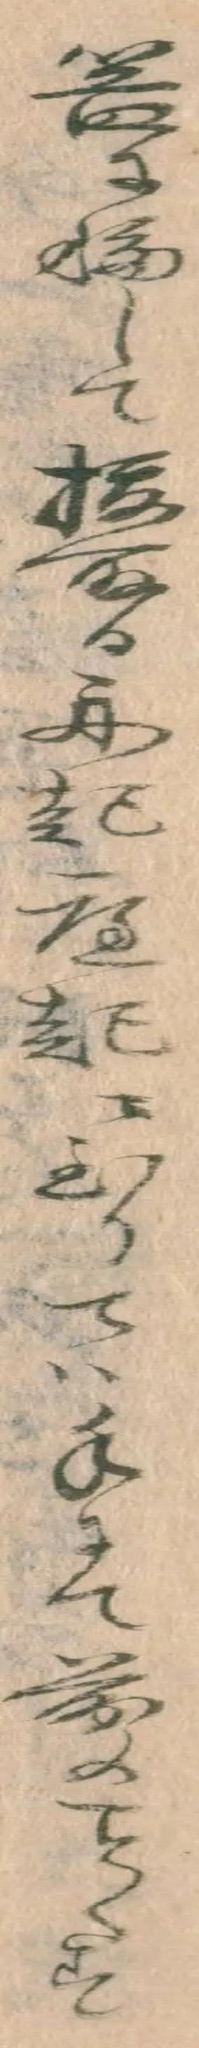器に移して抜取る舟起庭起ニ至りてハ手にて前のことくす
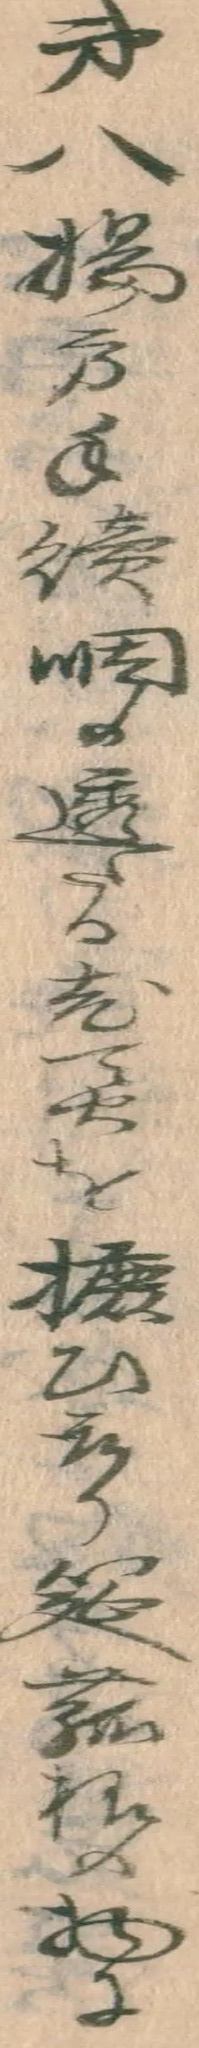第八揚方手続咽の透たる老蚕を摭ひ取り筵菰様の物に
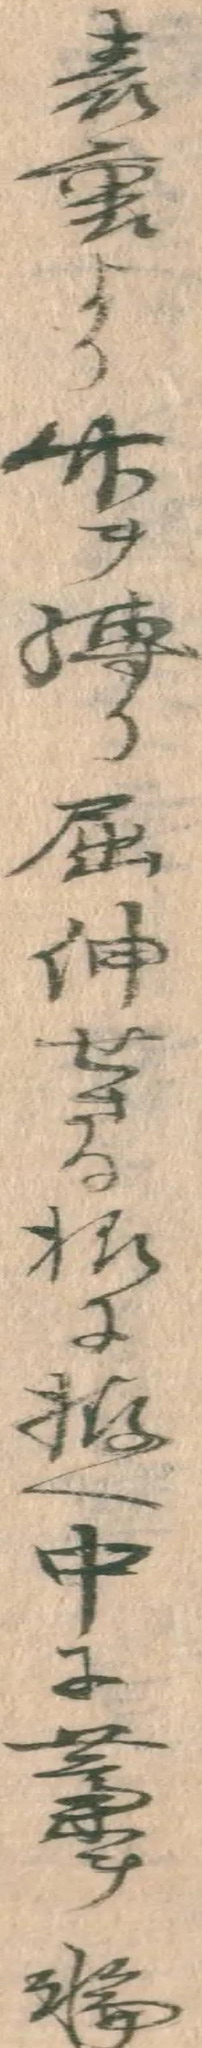表裏より竹を縛り屈伸せさる様に拵へ中に藁を輪
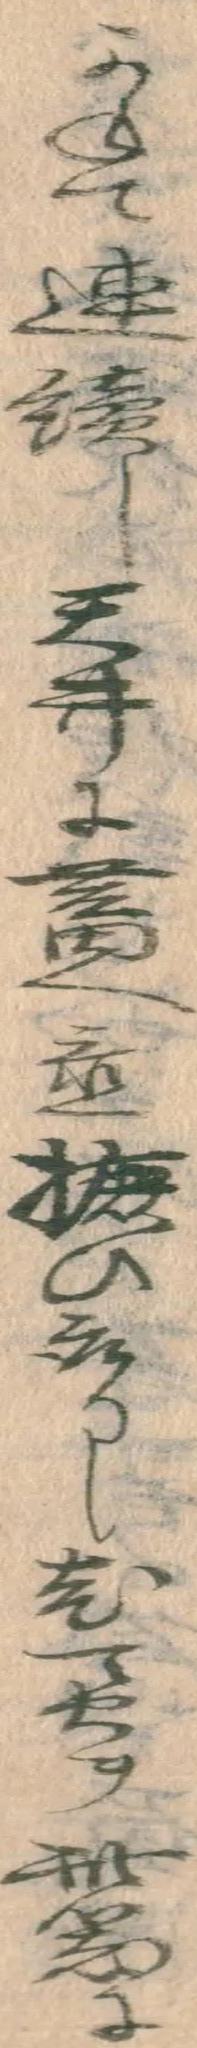かねて連続し天井に蓄へ置摭ひ取りし老蚕ヲ此器に
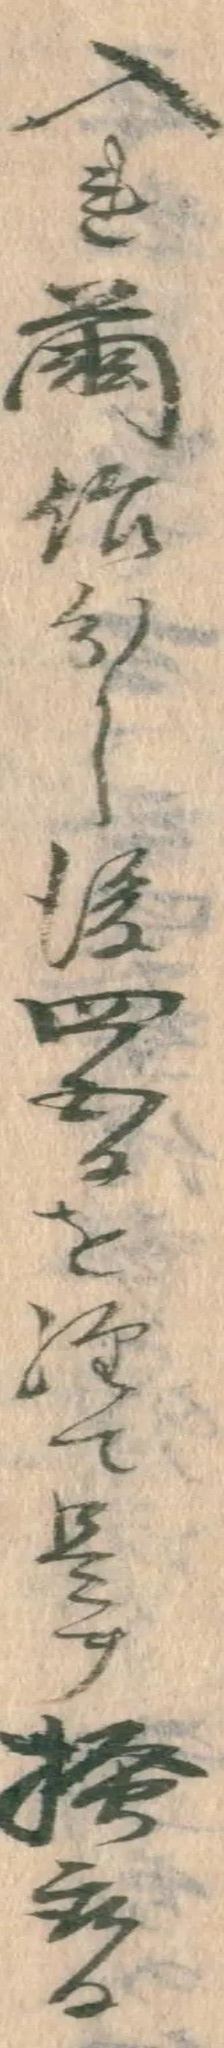入れ繭作分し後四五日を経て是ヲ掻取る
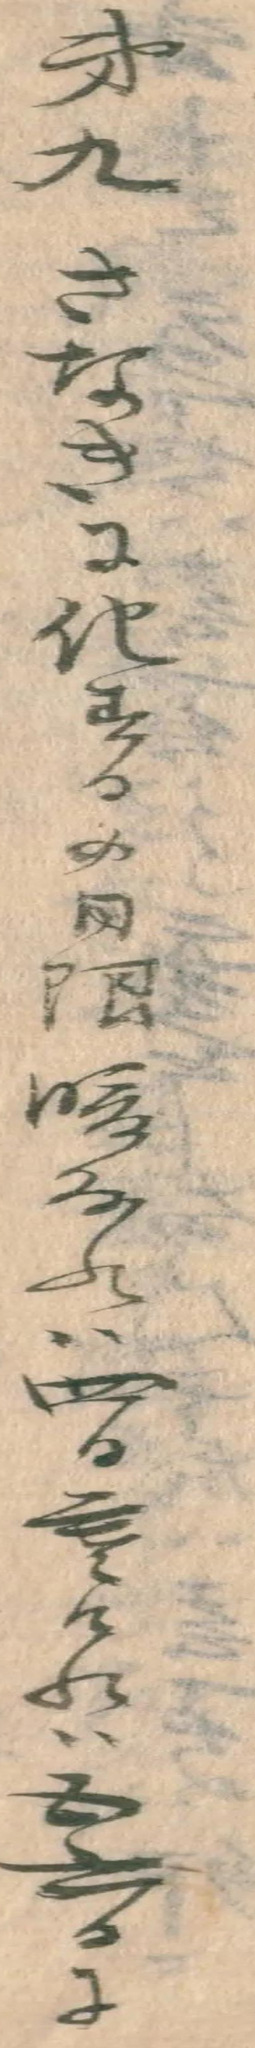第九さなきに化するの日限暖なれハ四日寒けれハ五六日に
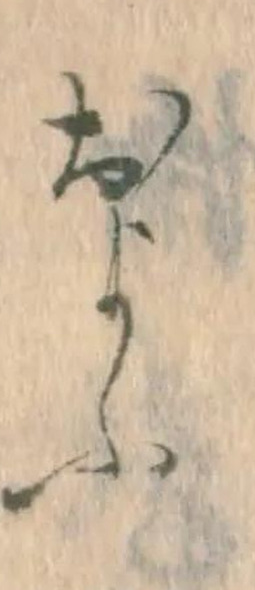およふ
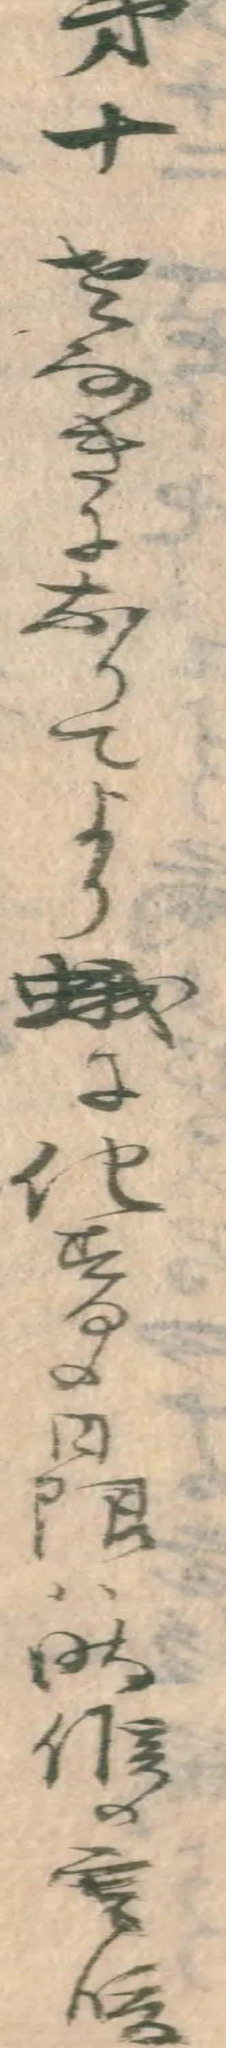第十さなきになりてより蛾に化するの日限は時候の寒暖
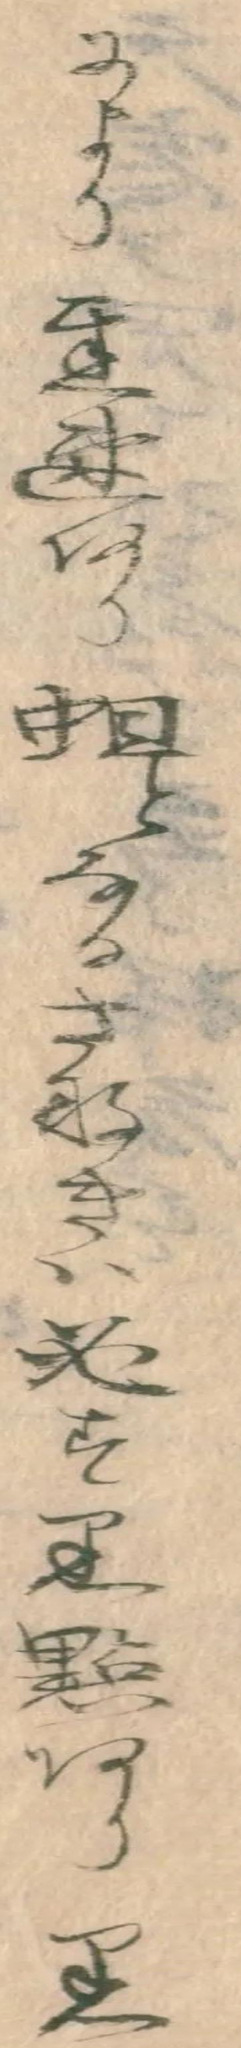により遅速あり蛆となるさなきハ必す黒点あり黒
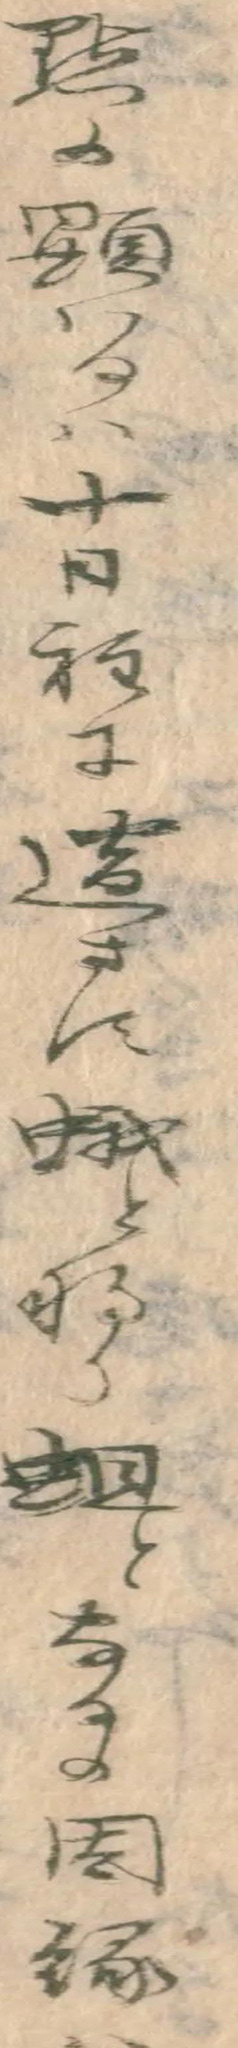点の顕ハるハ十日程に遺さす蛾となり蛆となるの因縁ハ
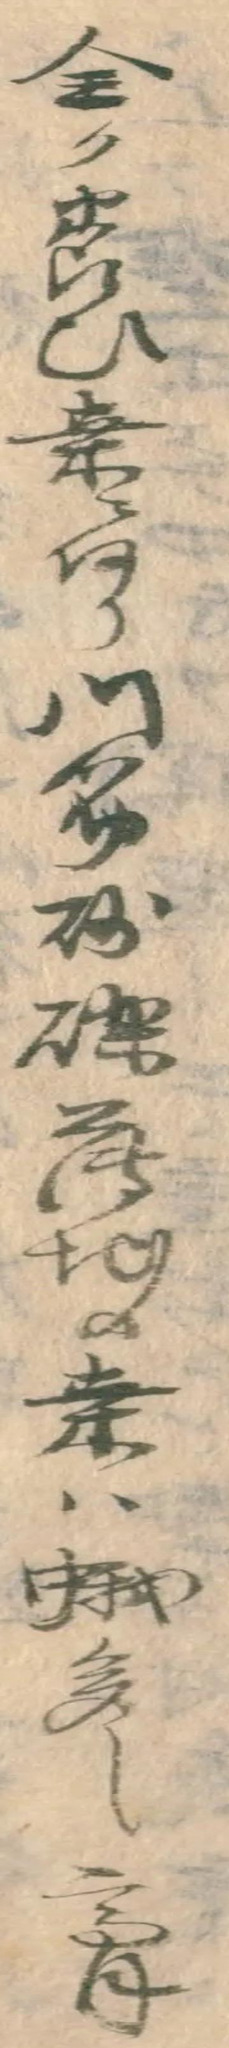全ク養ひ桑ニあり川筋砂礫薄地の桑ハ蛾多し高月
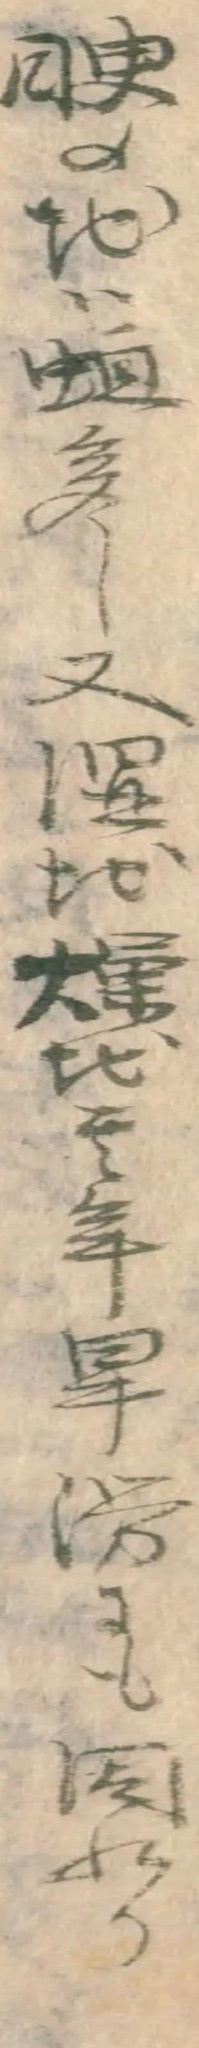腴の地ハ蛆多し又湿地燥地其年旱にも因れり

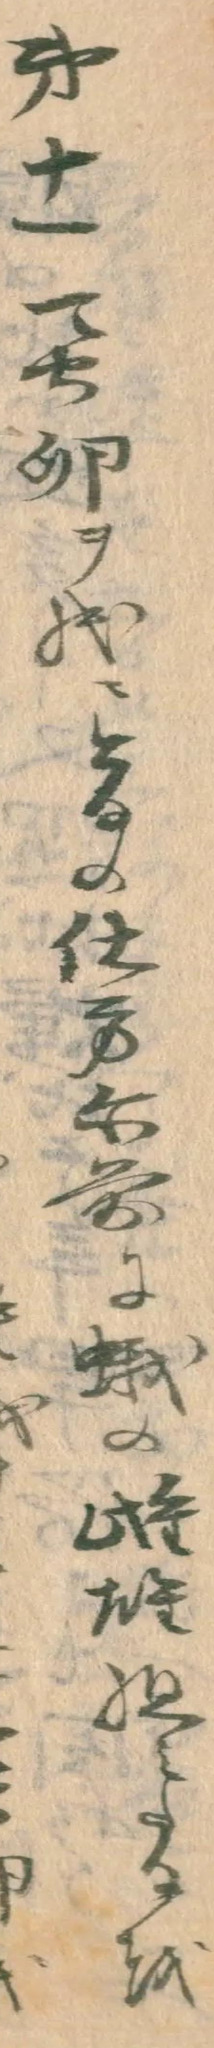第十一蚕卵ヲ紙ニとるの仕方爾前に峨の雌雄組ミたるを
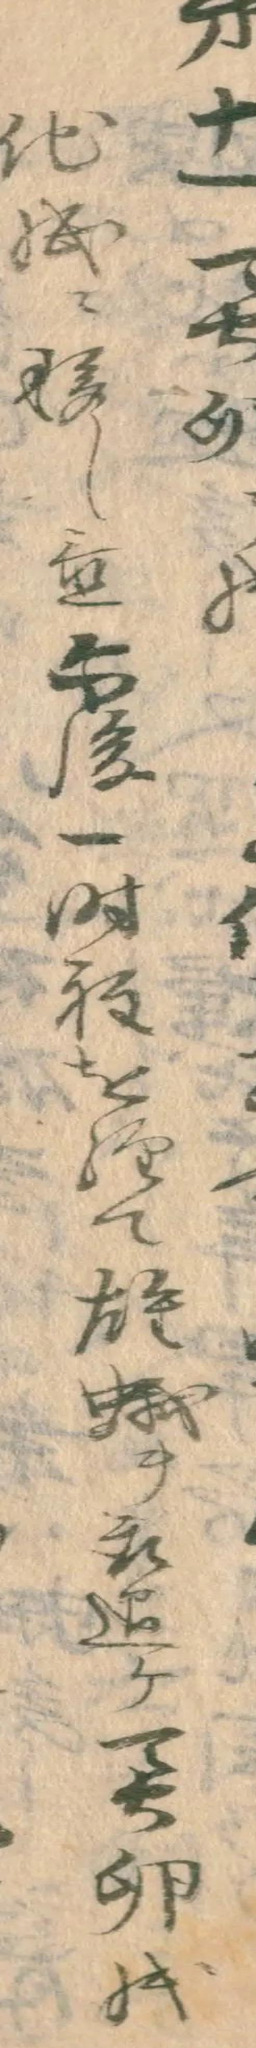他紙ニ移し置爾後一時程を経て雄蛾ヲ取退ケ蚕卵紙
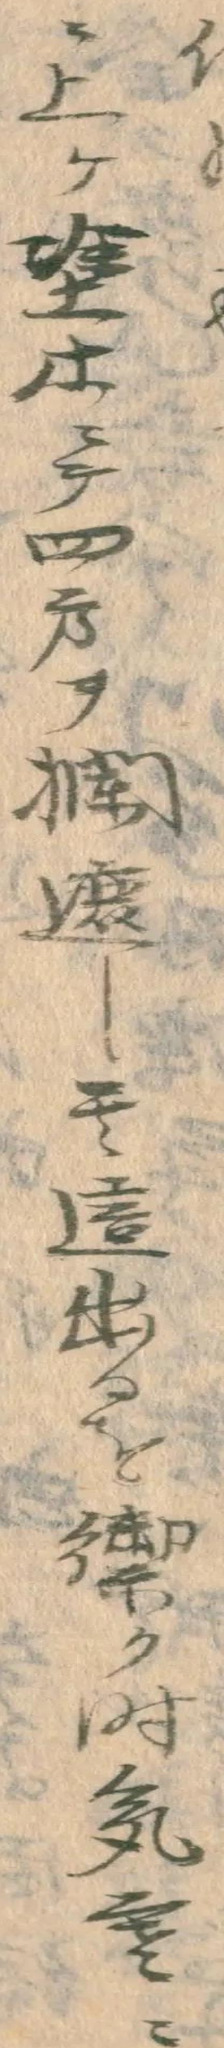ニ上ケ塗木ニテ四方ヲ欄遮し其這出るを禦ク時気寒ニ
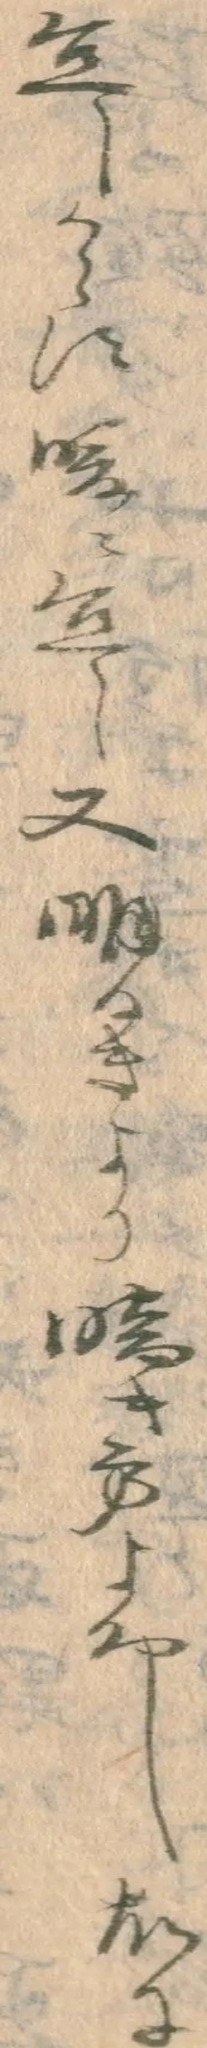宜しからす暖に宜し又明るきより暗き方よろし故に
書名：蚕桑集成
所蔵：国立国会図書館 National Diet Library, JAPAN
